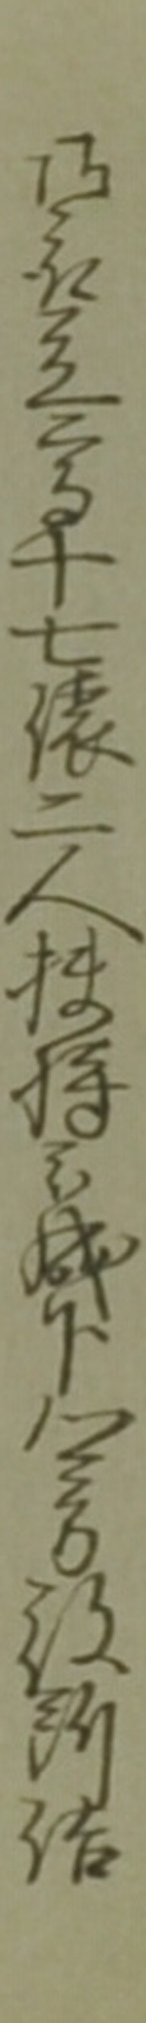御取立高十七俵二人扶持日被成下郷方役所詰
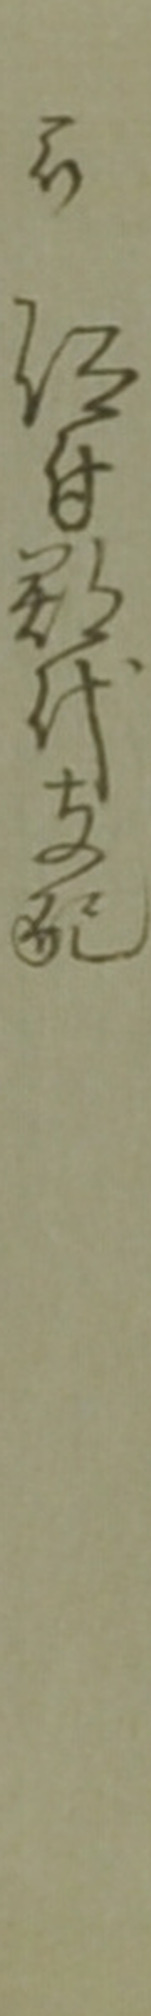被仰付郡代支配
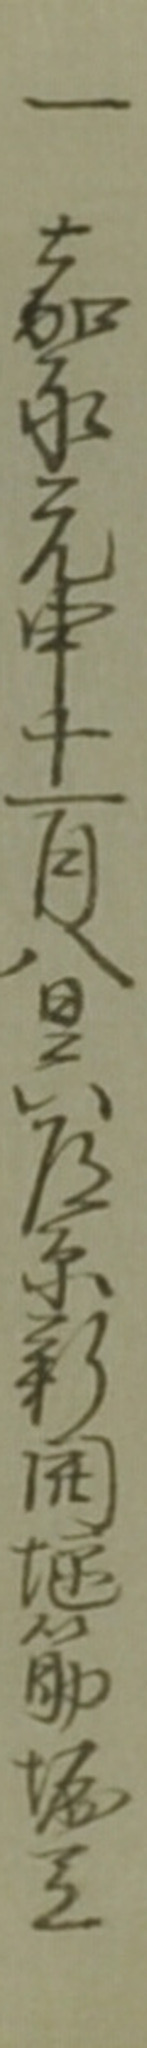一嘉永元申十一月八日六道原新開塸筋堀立
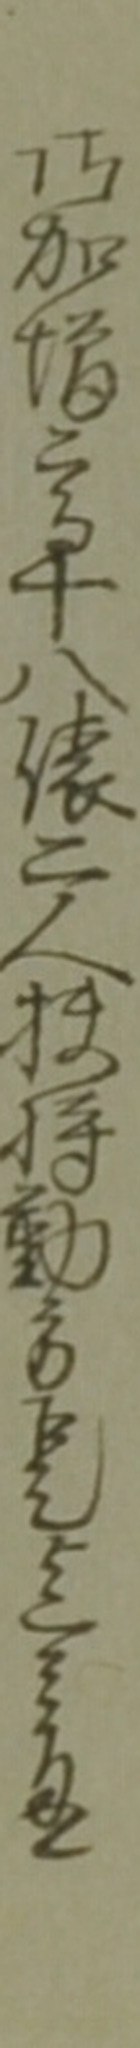御加増高十八俵二人扶持勤方是迄之通
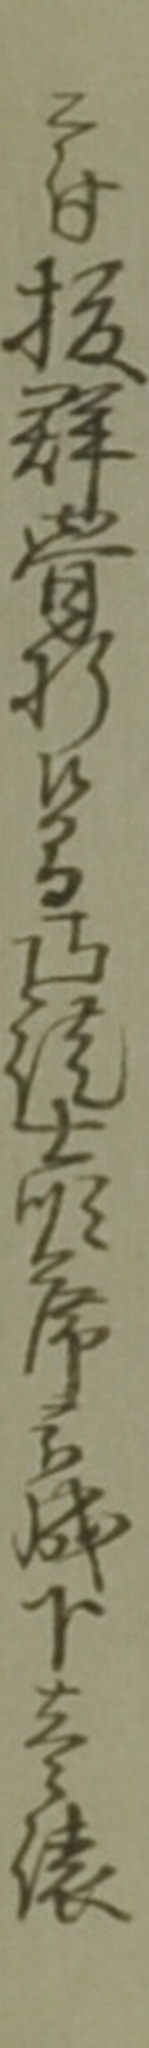ニ付抜群骨折候間御徒士順席被成下壱俵
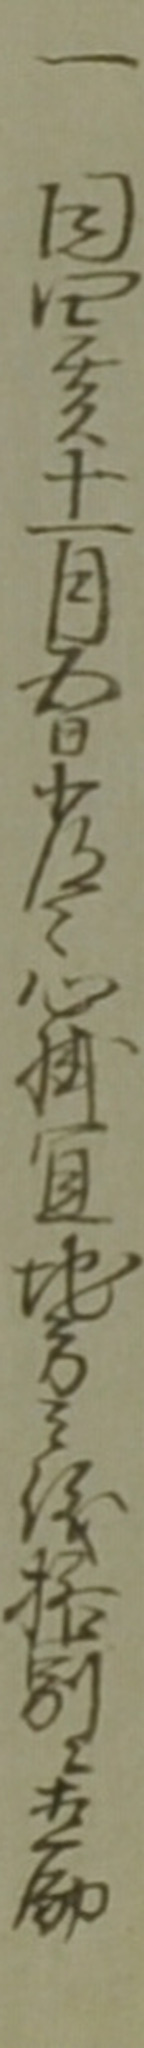一同四亥十一月五日常々心掛宜地方之儀格別ニ相励
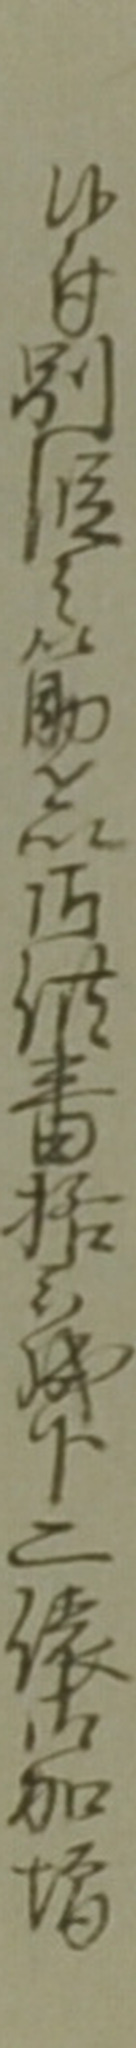候付別段之筋を以御供番格被成下二俵御加増
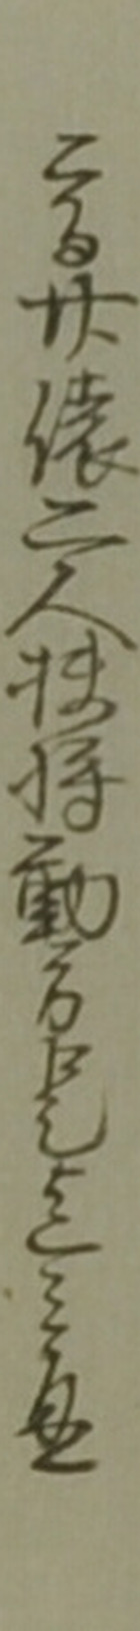高廿俵二人扶持勤方是迄之通

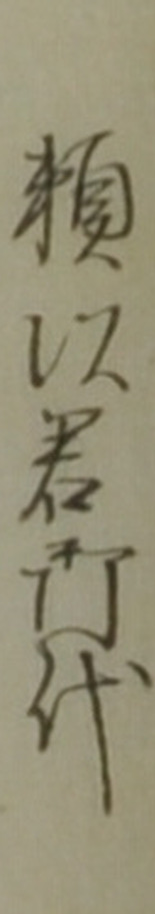頼以君御代
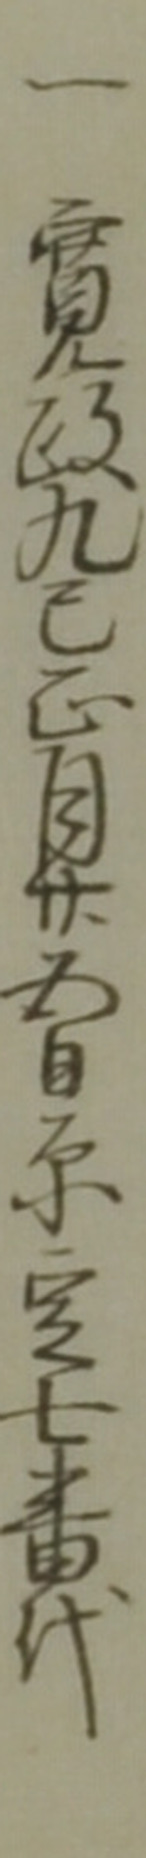一寛政九巳正月廿五日原定七番代
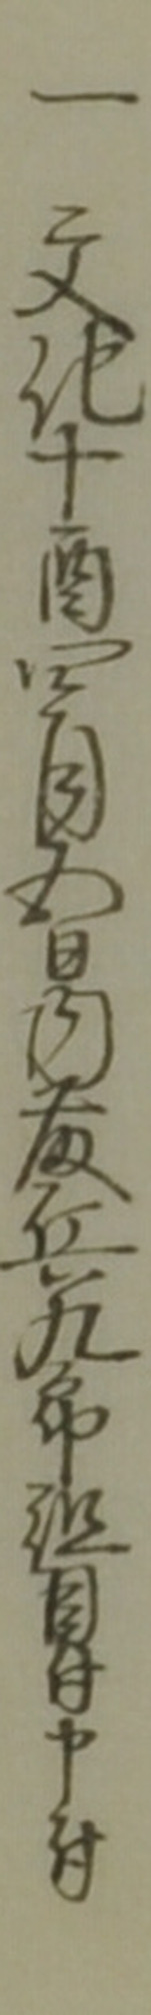一文化十酉四月五日内藤兵九郎組目付申付
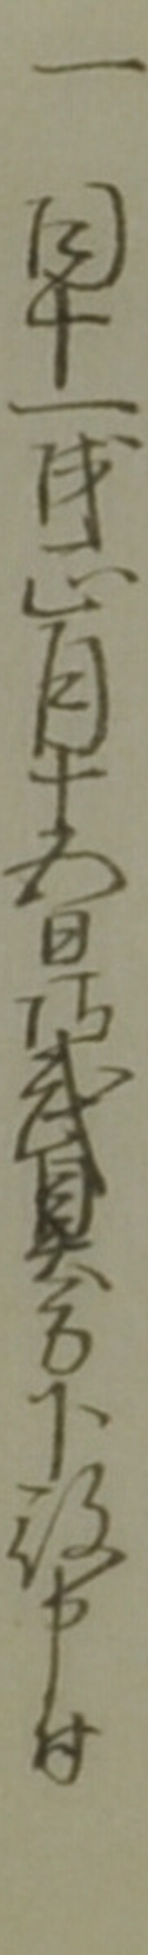一同十一月戌正月十五日御武具方下役申付
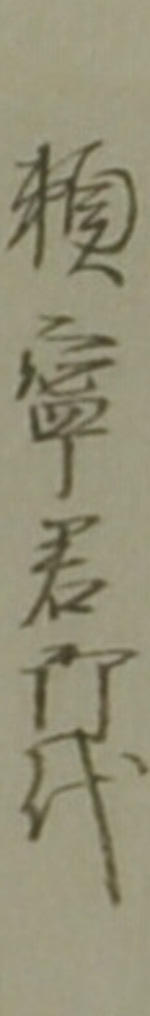頼寧君御代
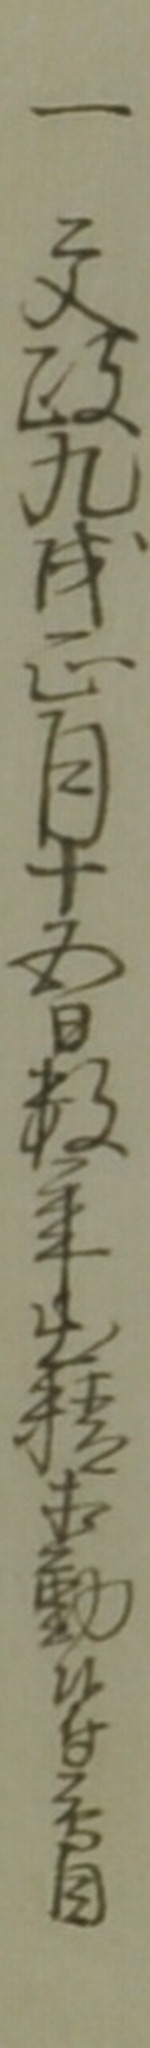一文政九戌正月十五日数年出精相勤候付鳥目
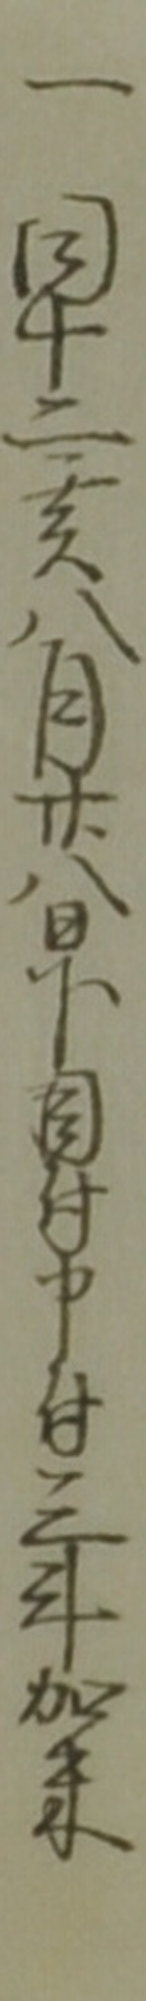一同十二亥八月廿八日下目付申付三斗加米
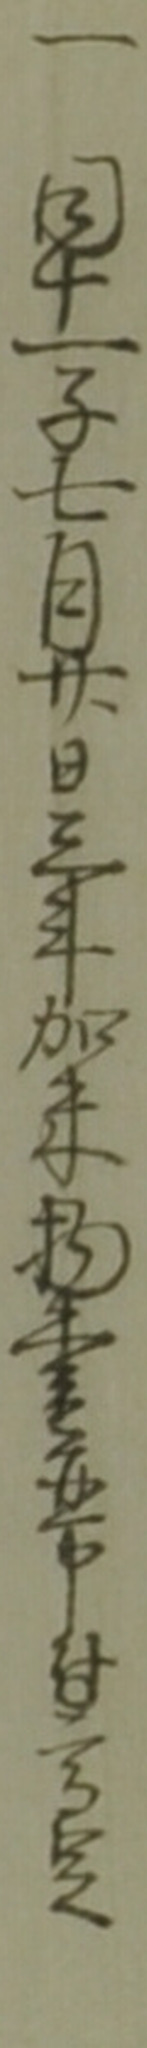一同十一子七月廿日三斗加米物書並申付馬足
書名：無足諸士勤仕録（八）
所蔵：伊那市立高遠町図書館・合同会社AMANE
